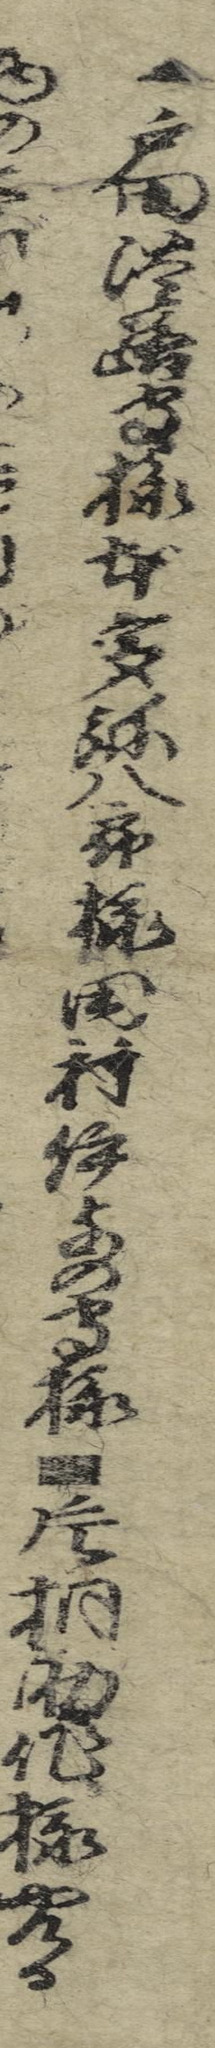▲戸田淡路守様本多弥八郎様田村伊予の守様片桐助作様やける
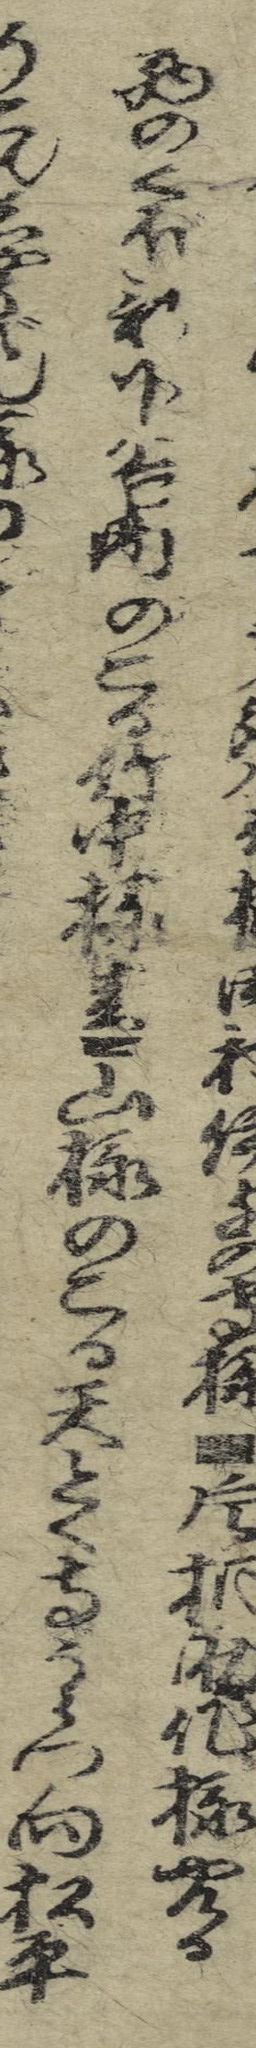西のくほ下谷町のこる竹中様青山様のこる天とく寺うら門向松平
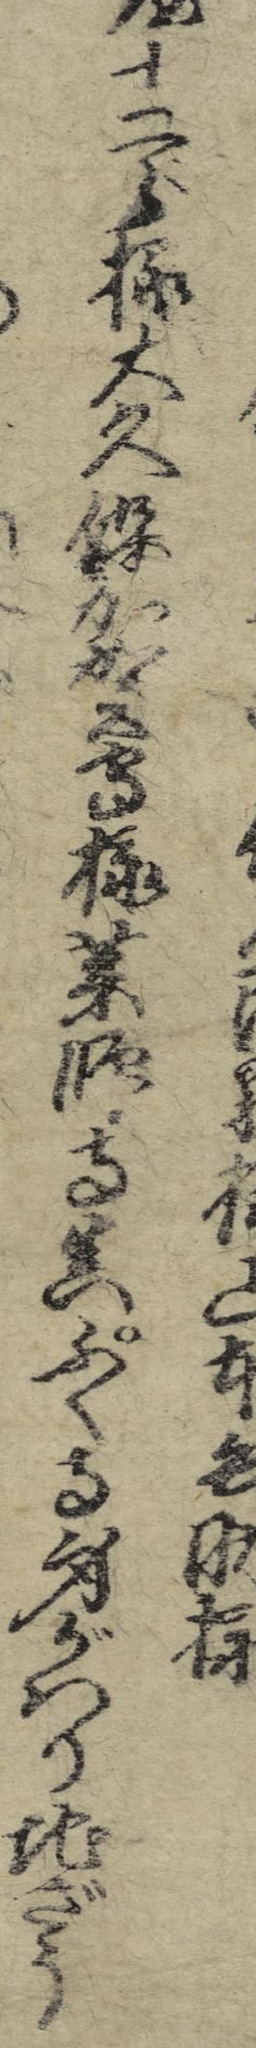土屋十二郎様大久保加賀守様薬師寺真ぷく寺身がはり地ざう
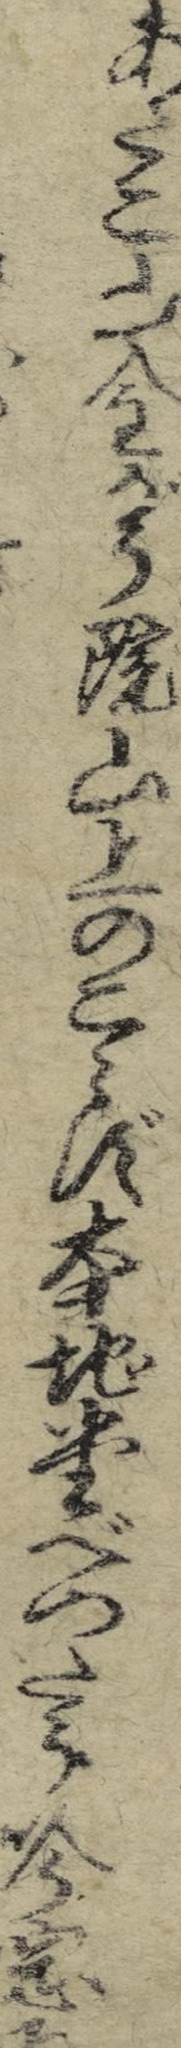あたご山金がう院山上のこらず本地堂べつたら吟窓ゐん
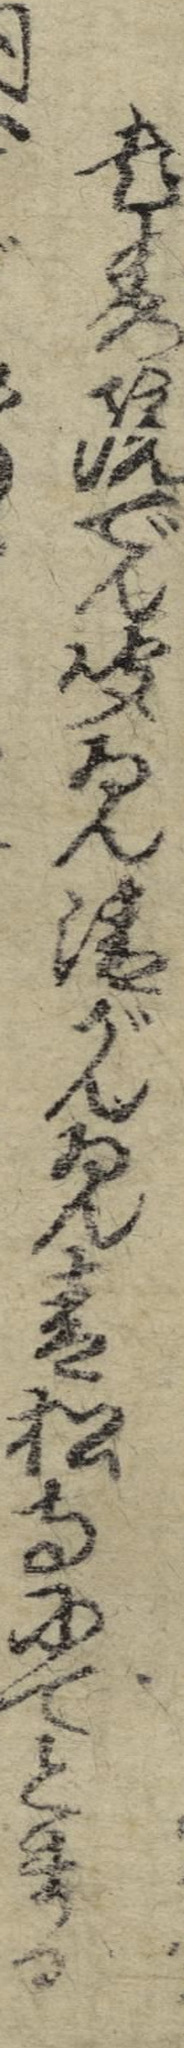走寿院でん聞ゐん清がんゐん青松寺にてとまる
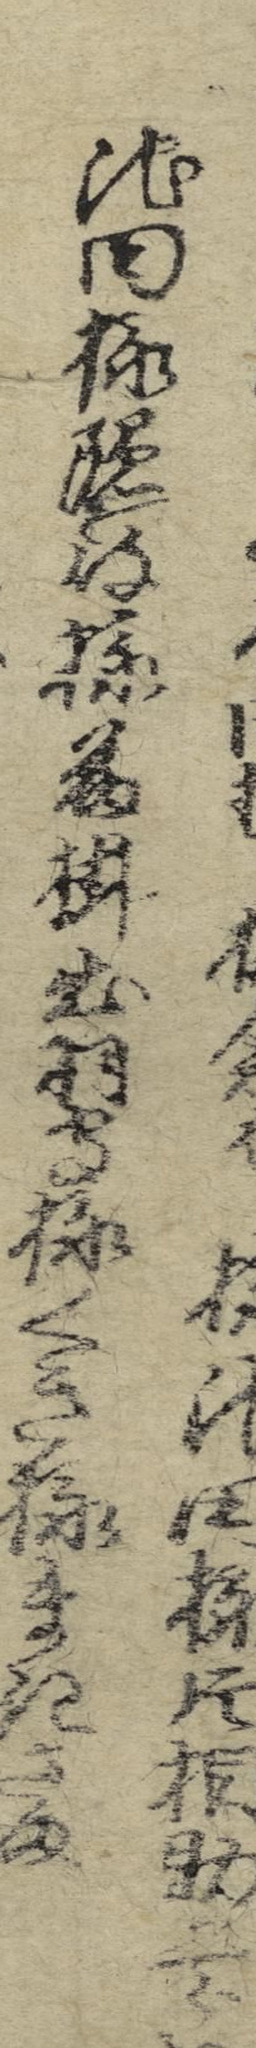池田様隠岐様藤掛出羽守様くき様まきさま
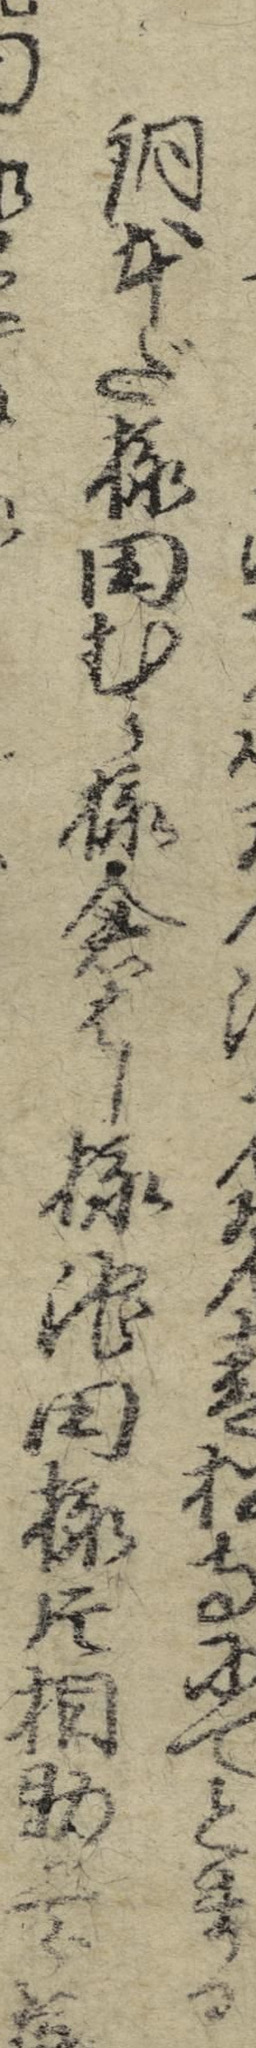銅本ざ様田むら様倉はし様池田様片桐助作様
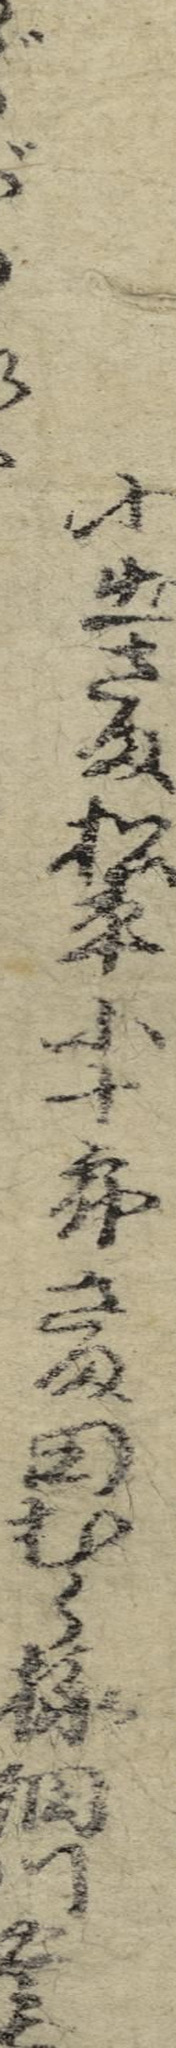小出さま松平小十郎さま田むら様細川豊前守様
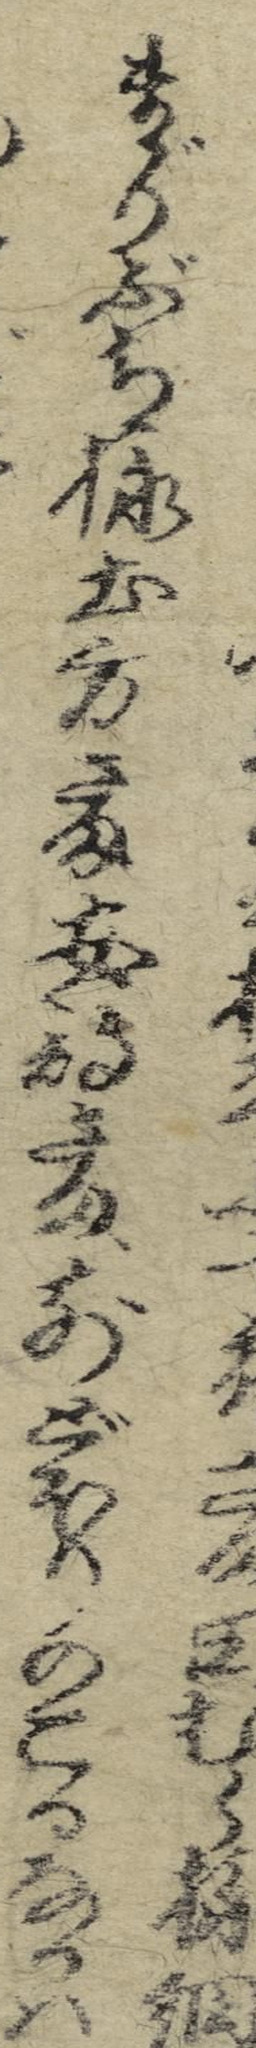まがりぶち様土方さま安部さま前どほりのこるなかは
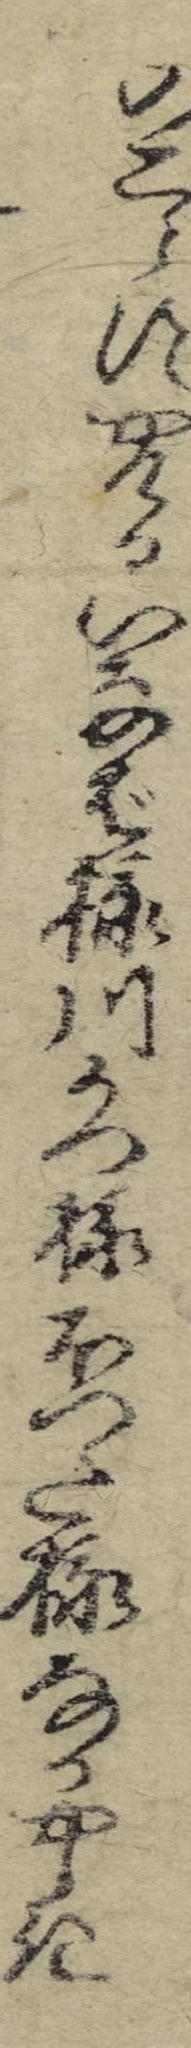のこらずやけるいなば様川かつ様ほつた様なかやしき
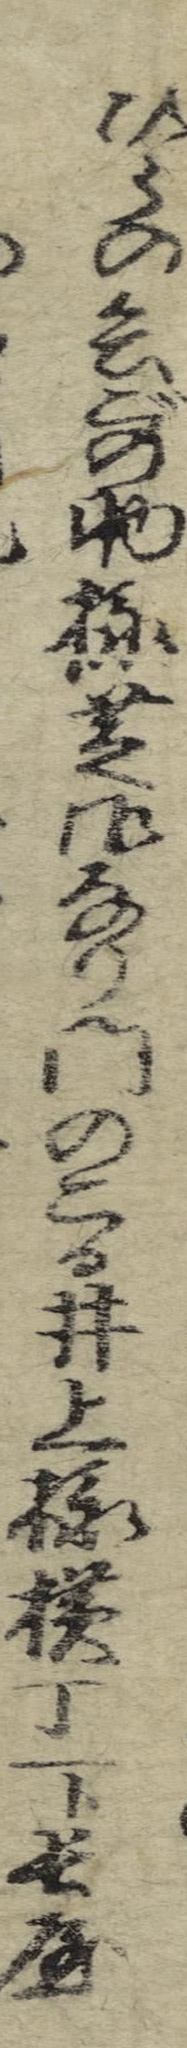ひらの兵ごの助様芝御なり門のこる井上様横丁下長屋
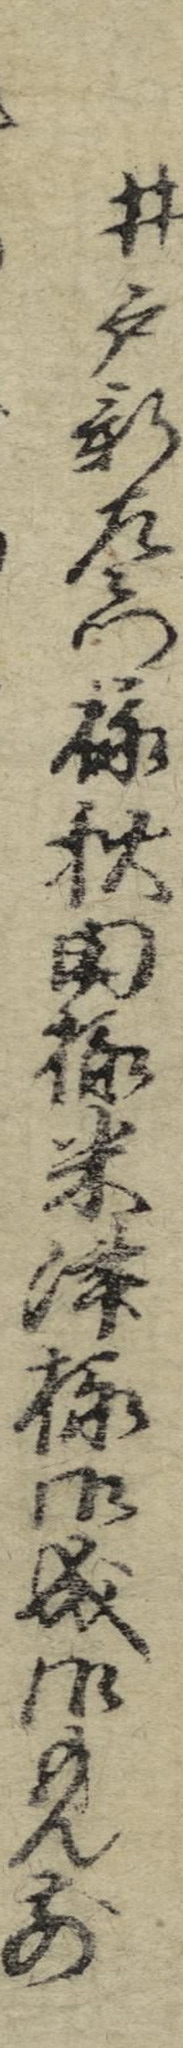井戸新左衛門様秋田様米津様御成御もん前
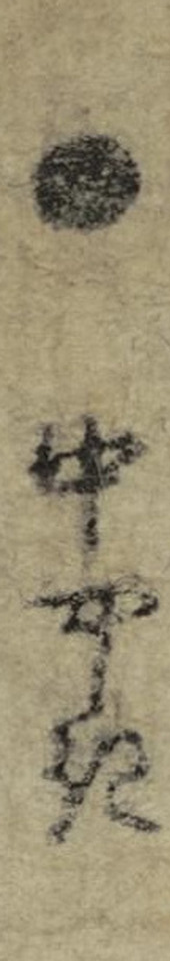●中やしき
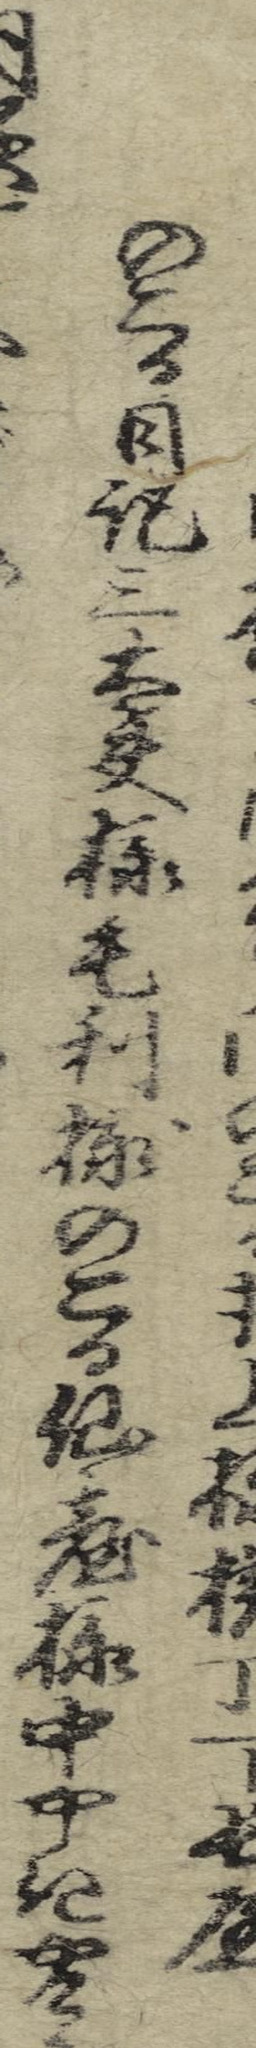のこる目記三太夫様毛利様のこる仙台様中やしきやける
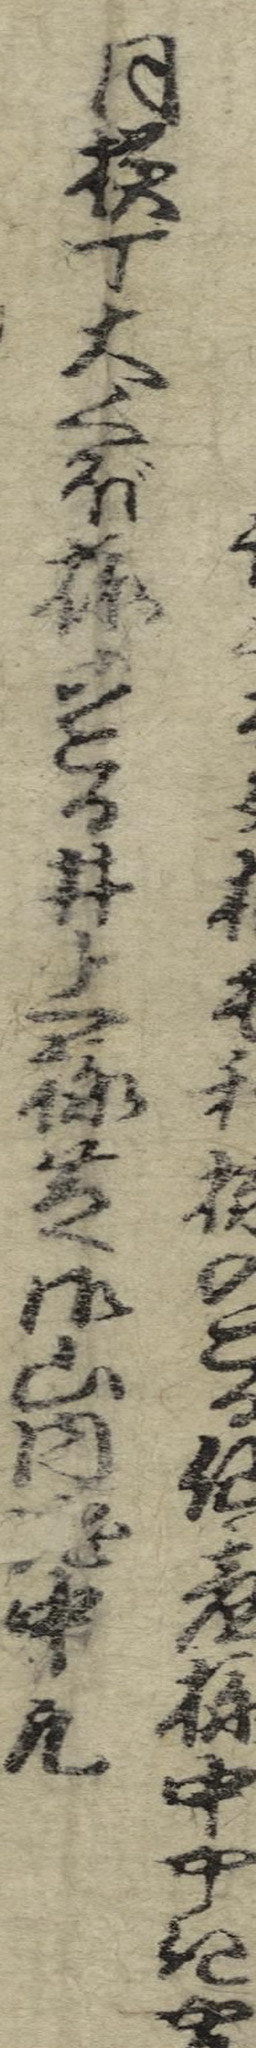同横丁大くぼ様のこる井上様芝御山内地中凡
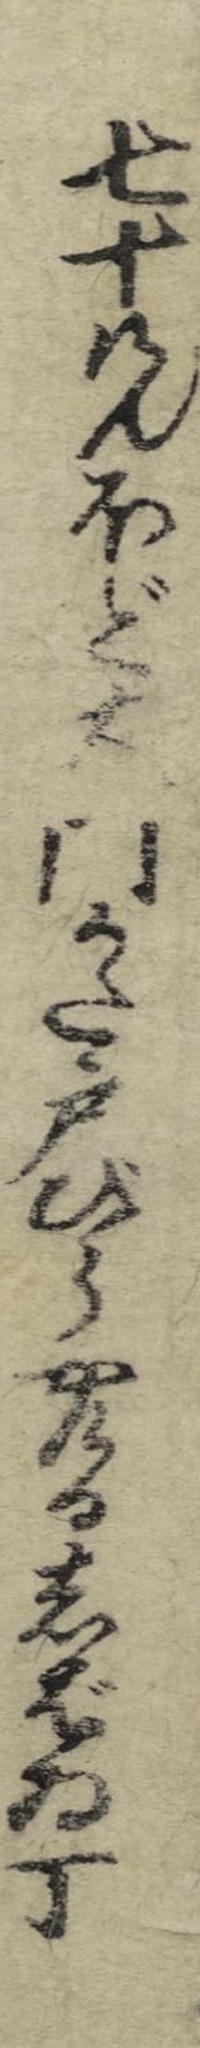七十けんほど大門かた戸びらやけるしばゐ丁
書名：[嘉永三年二月の江戸大火に関する瓦版]
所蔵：東京大学地震研究所図書室 Earthquake Research Institute Library, The University of Tokyo, JAPAN
